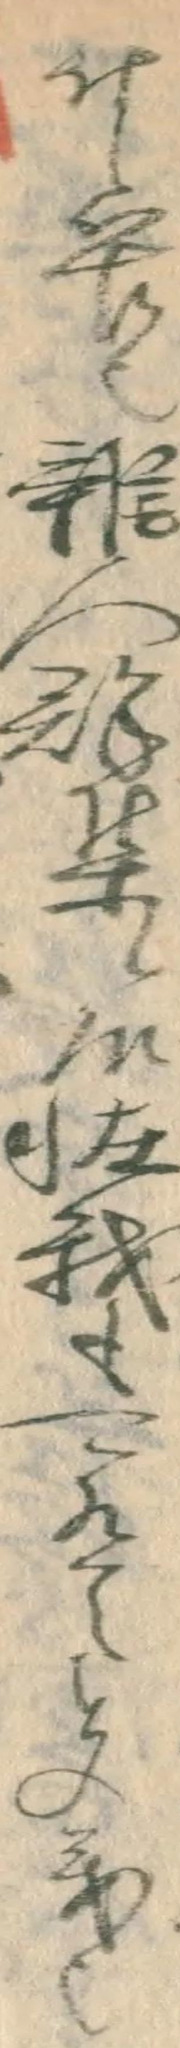付候筈也雑人群集候故怪我も可有之との義也
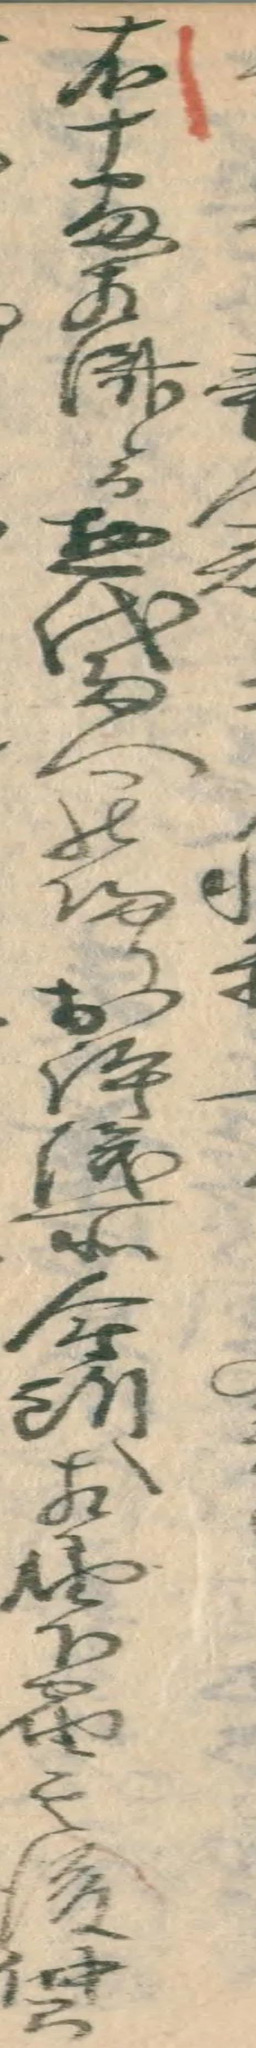右十番相済候而惣代両人罷帰り於評議所会所へ相届下宿其後仲間
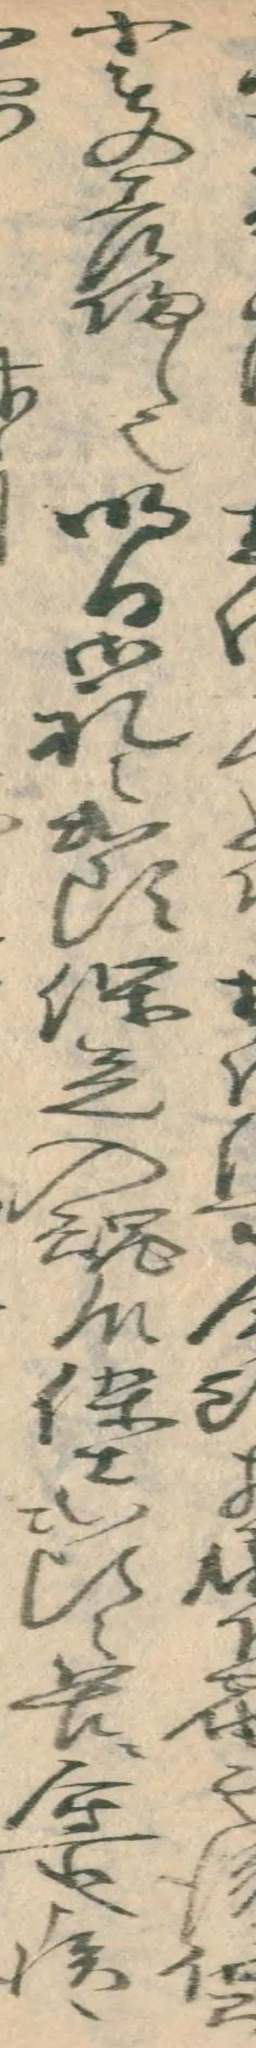小もの差帰候也明日御礼之出頭保覚入魂故保土出頭之筈ニ会所へ申談候
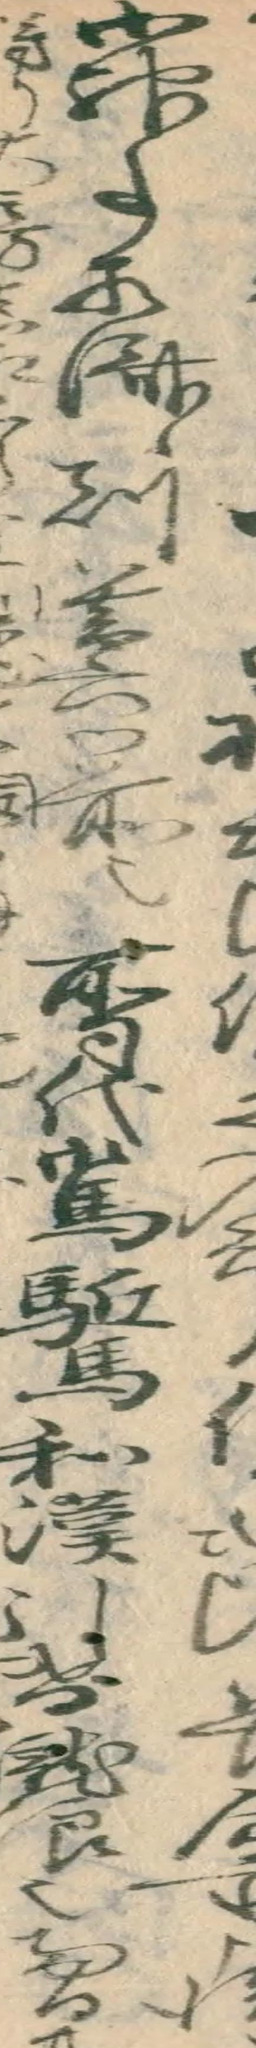御神事相済候刻暮六ツ前也所司代御馬駈馬和漢引替瀧浪也両日共
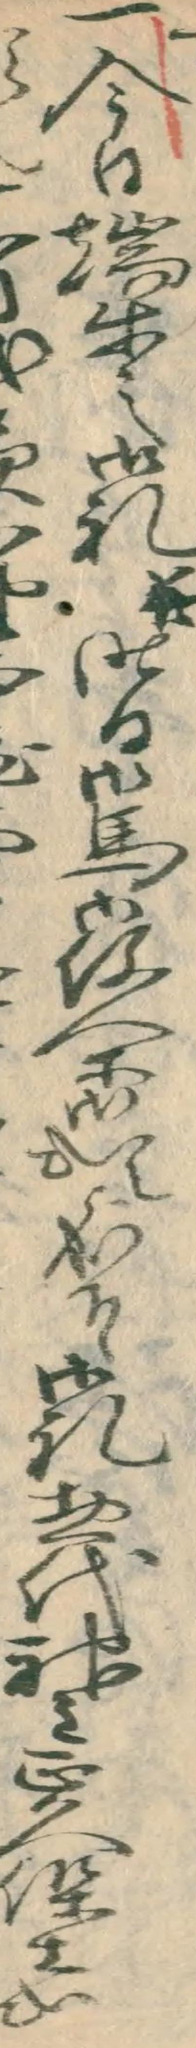一今日端午之御礼并昨日御馬御役人等御出シ被成下候御礼惣代神主正久保土出
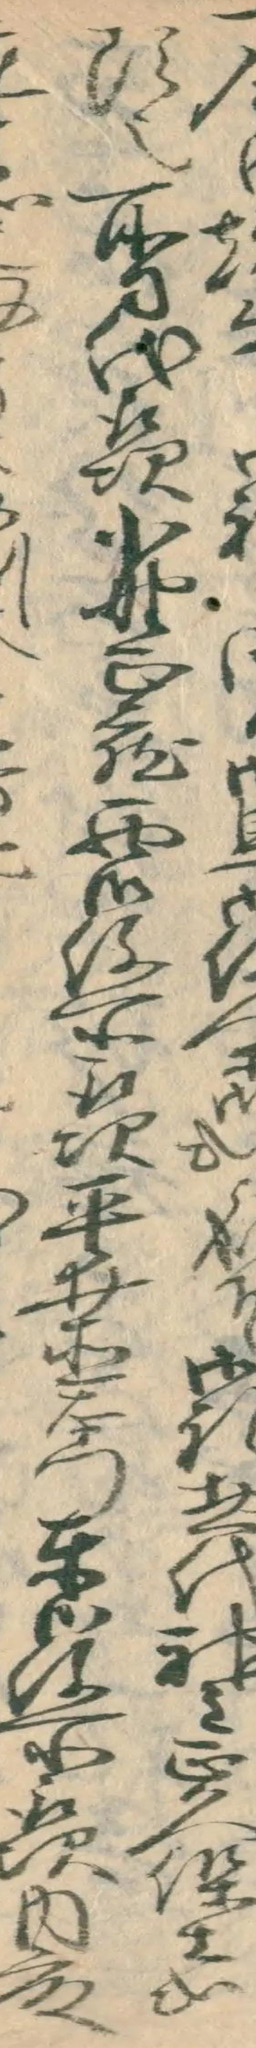頭也所司代取次小野正蔵西御役所取次平井直右衛門東御役所取次内藤
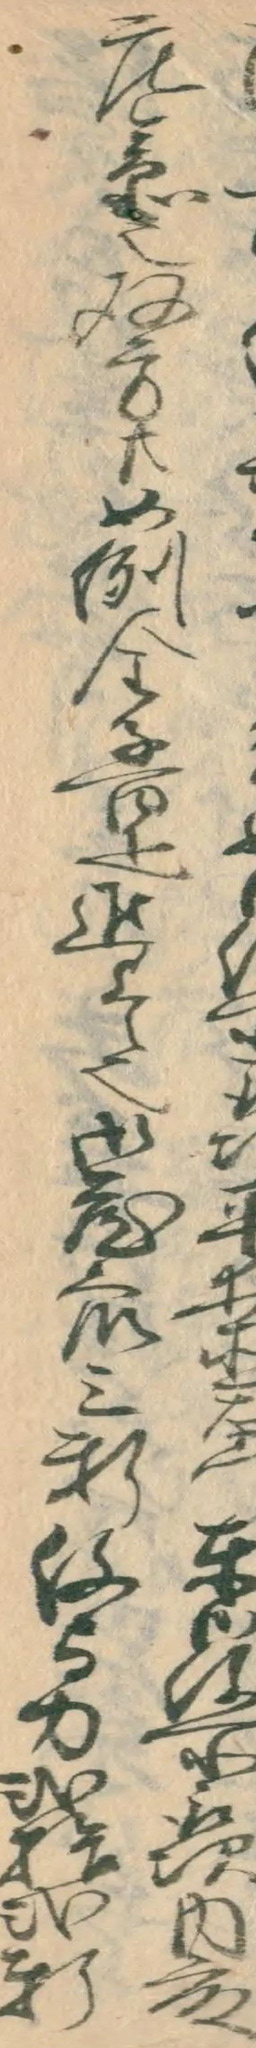庄兵衛也双方共如例金子百疋進上候也御蔵衆三軒役与力弐拾弐軒

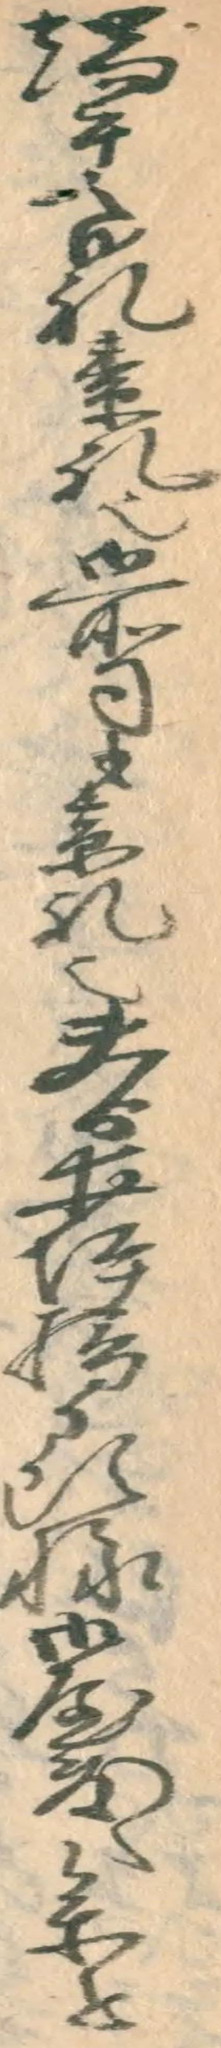端午之御礼素礼也御所司も素礼也夫ゟ井伊掃部頭様御屋敷へ参上
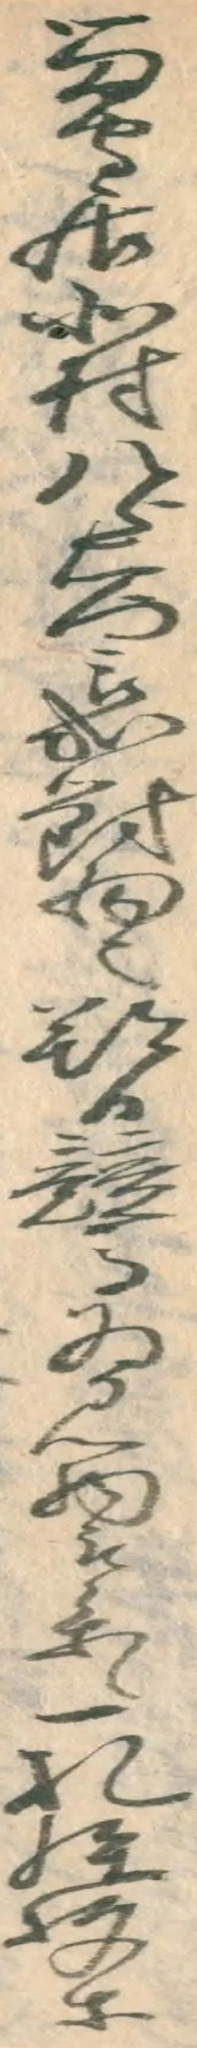留守居北村八郎右衛門被出対面也朔日競馬為見物被参候一札挨拶等
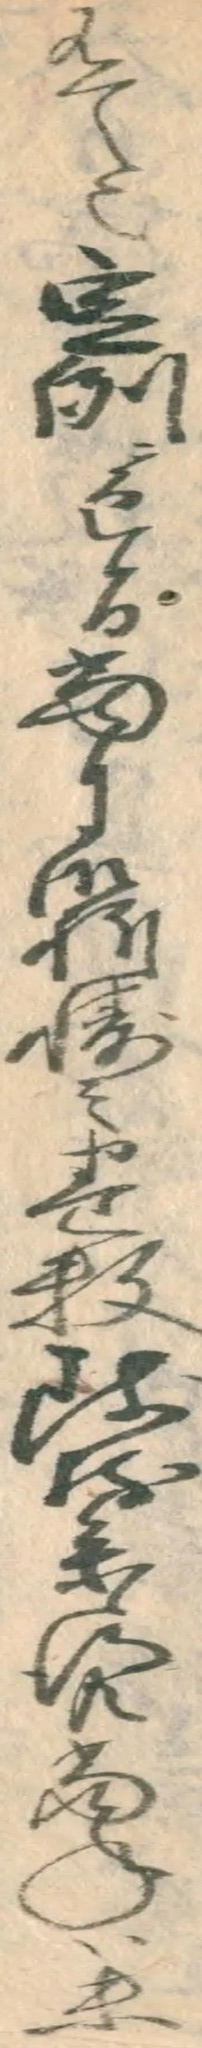有之也定例ニ而今日当月御祈祷之巻数致持参候得共当年ハ未
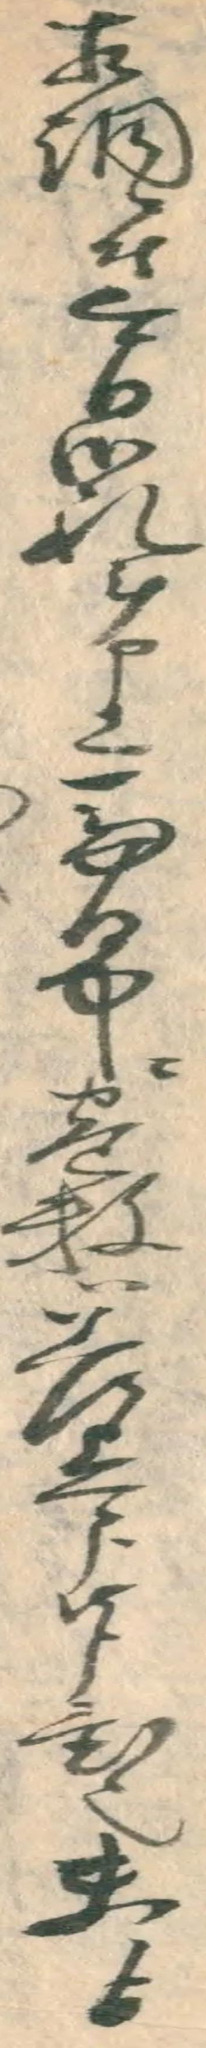相調ニ付今日御礼計申上一両日中ニ巻数ハ差上申由申置也夫ゟ
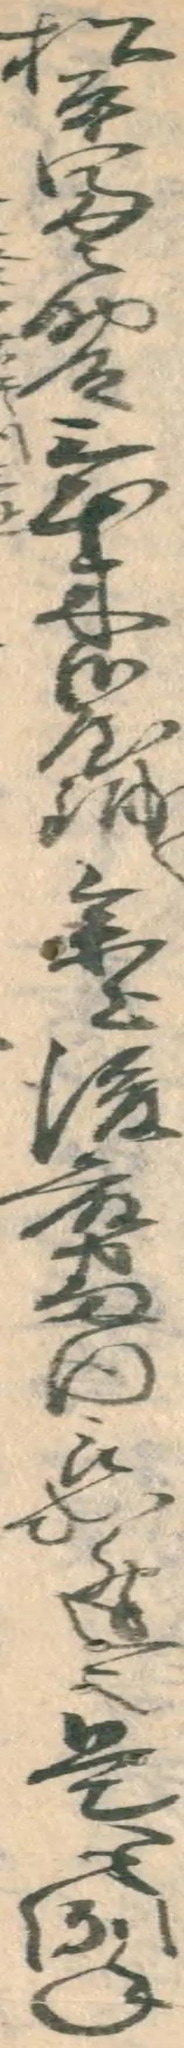松平富之助殿三本木御屋鋪へ参上後藤番内被出逢也是へも例年
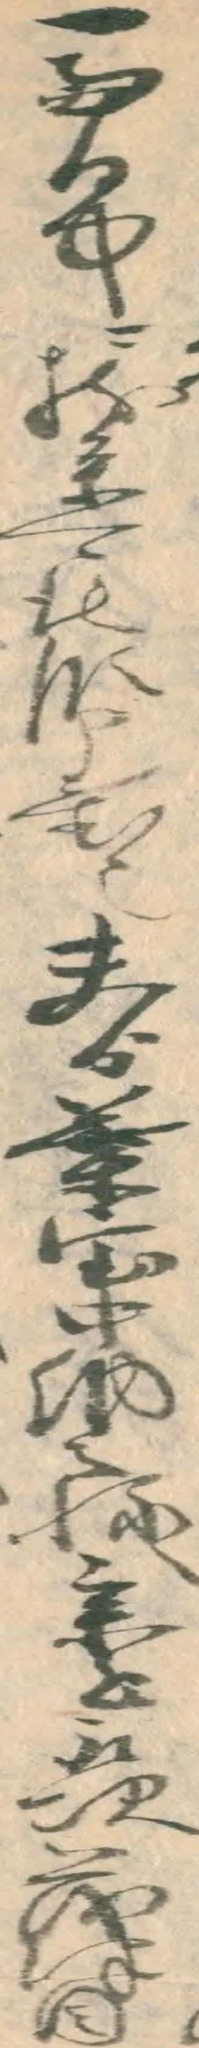一両日中ニ持参可仕段申置也夫ゟ葉室中納言様へ参上取次茂津目
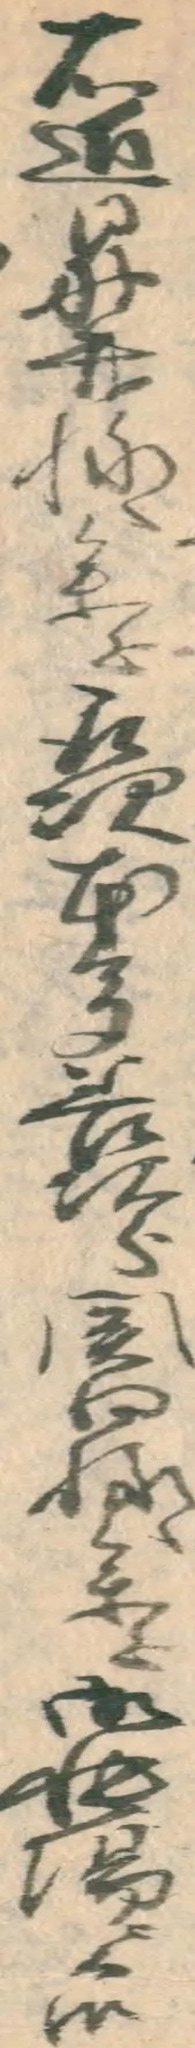右近日野弁様へ参上取次本多善次郎関白様へ参上御帳場ニ而御
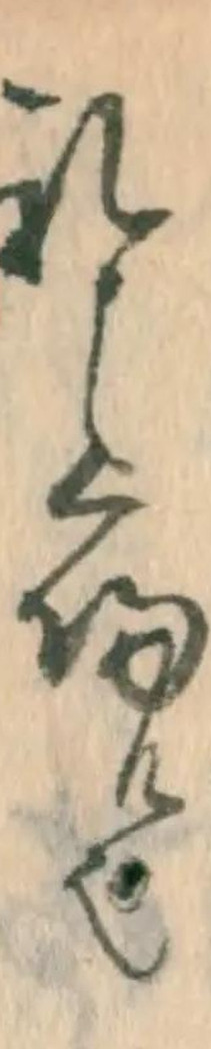礼申上帰ル也
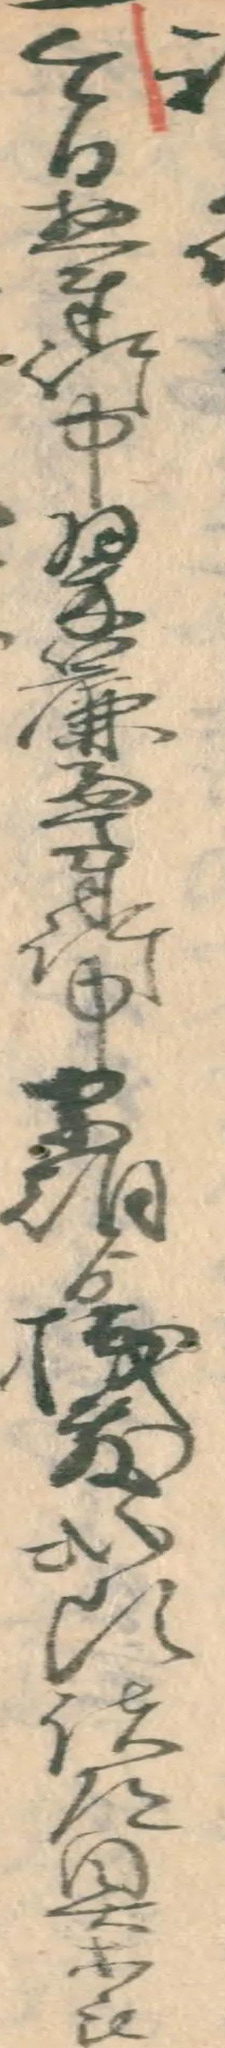一今日惣奉行中翠簾畳奉行中早朝ゟ桟敷へ出頭諸道具等被
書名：賀茂社記録. 第58冊
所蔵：国立国会図書館 National Diet Library, JAPAN
